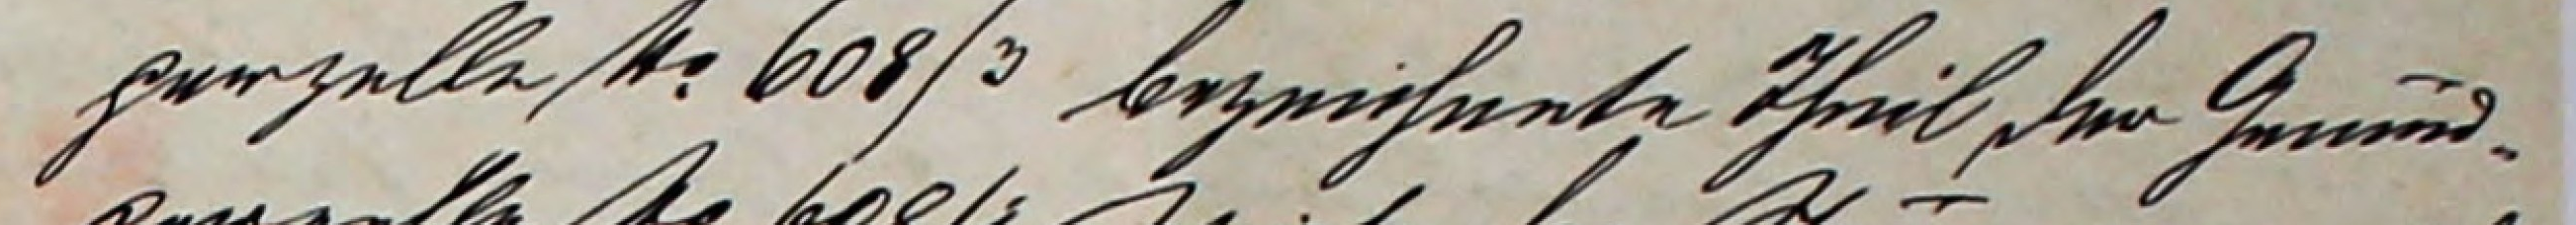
Parzelle No 608/3 Bezeichnete Theil der Grund„
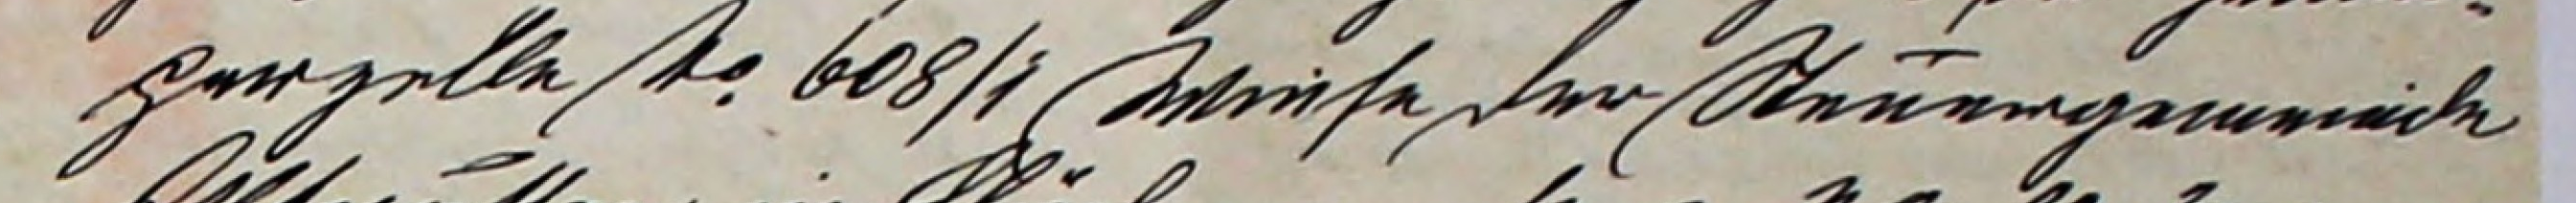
parzelle No 608/1 Wiese der Steuergemeinde
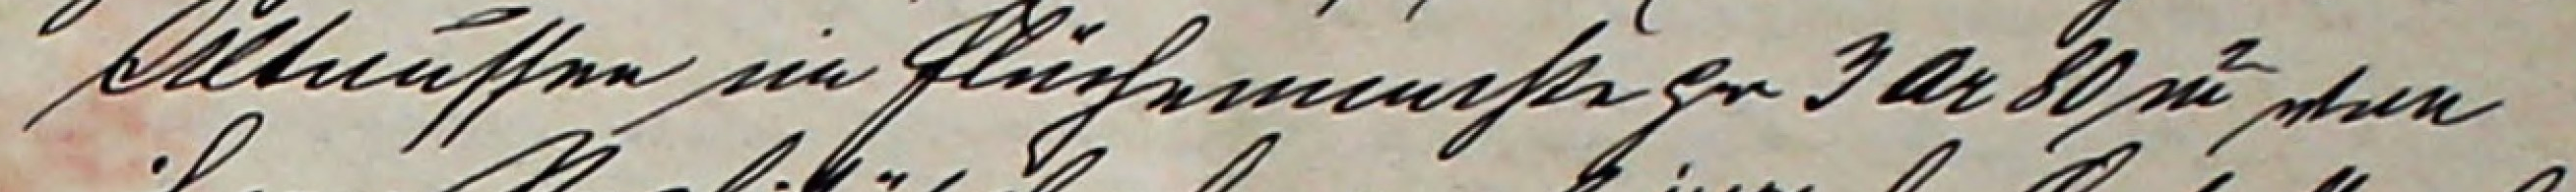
Altaussee in Flüchennachte pr 3 Ar 80 m2 von
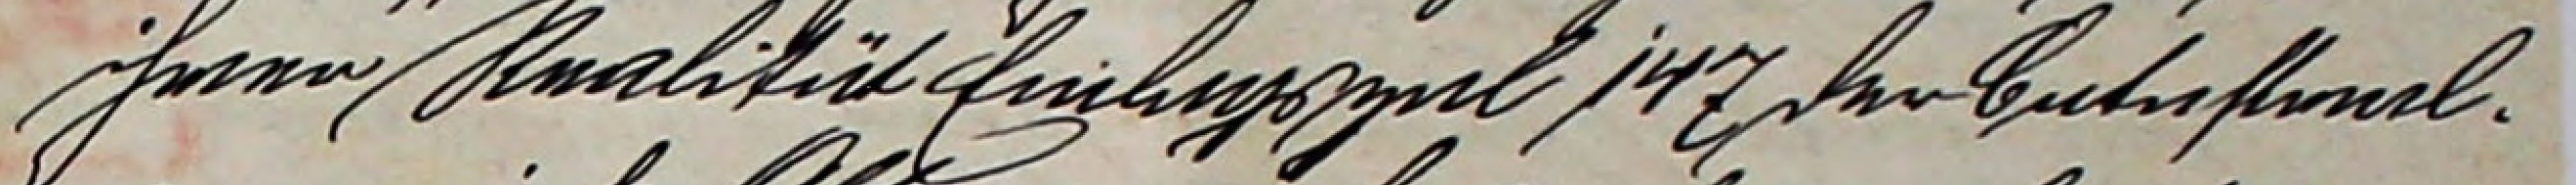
ihrer Realität Einlagszal 147 der Catastral„
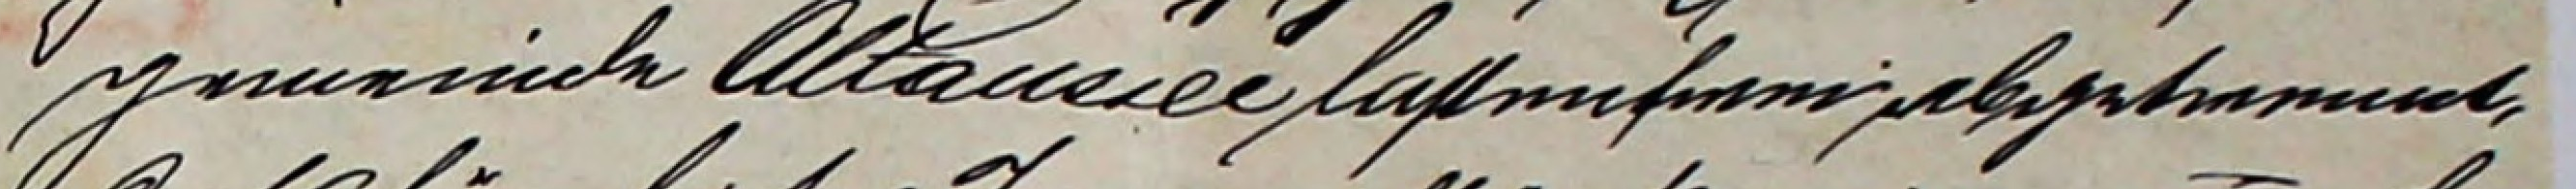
gemeinde Altaussee lastenfrei abgetrennt,
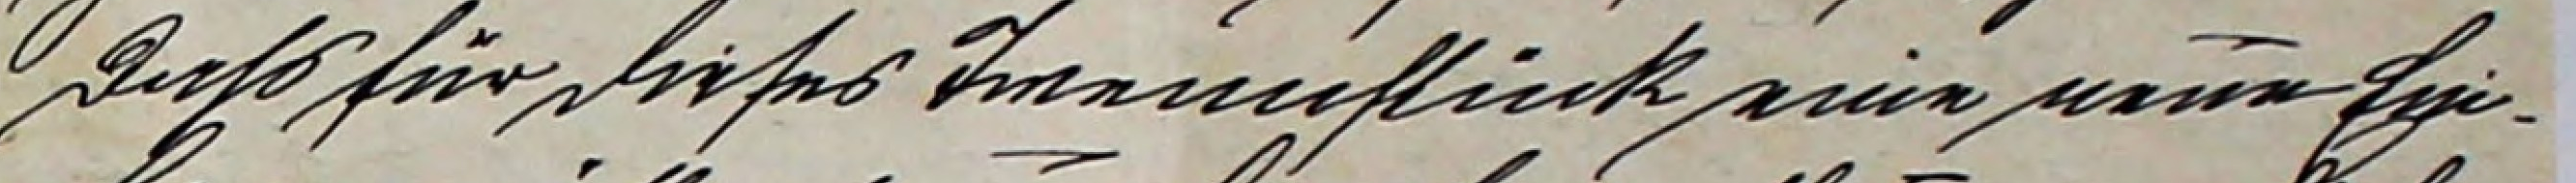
dass für dieses Trennflück eine neue Ein-
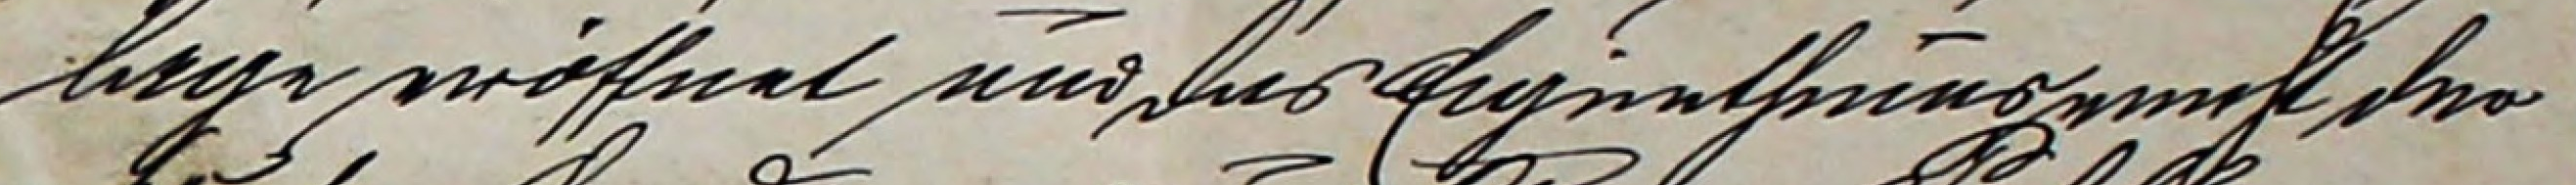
lage eröffnet und das Eigenthumsrecht der
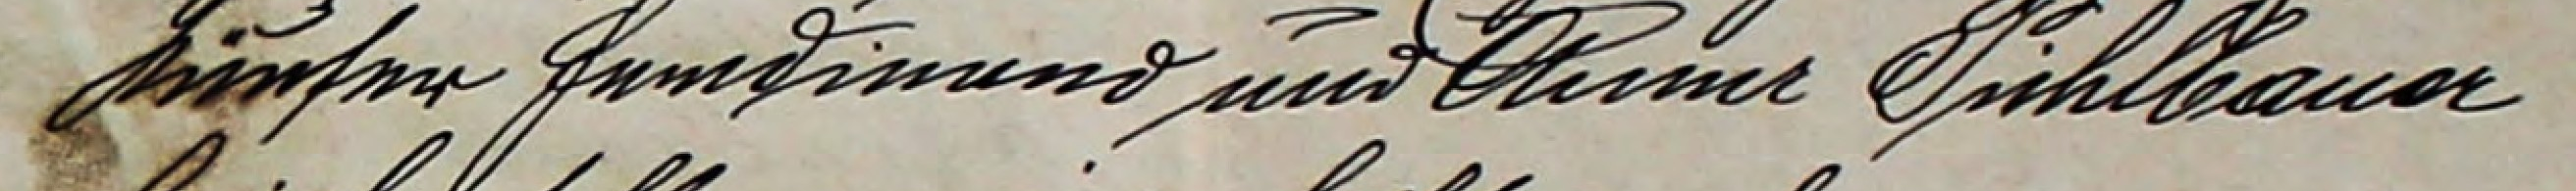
Käufer Ferdinand und Anna Pichlbauer
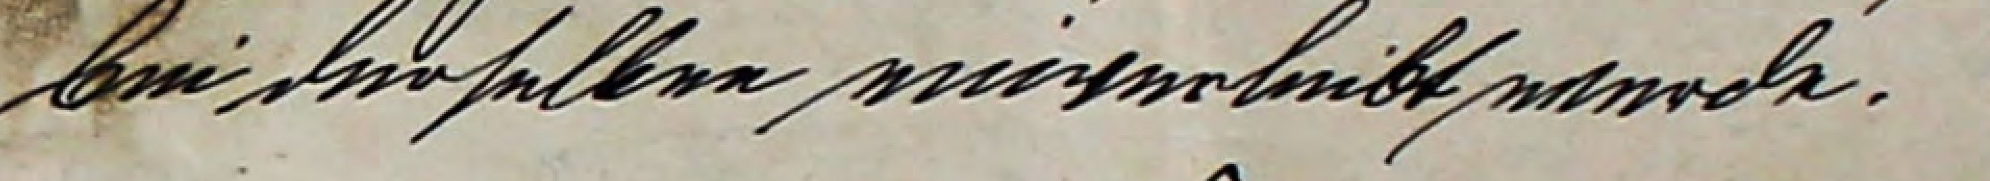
bei derselben einverleibt werde.
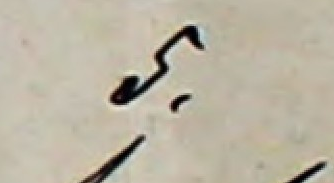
5.
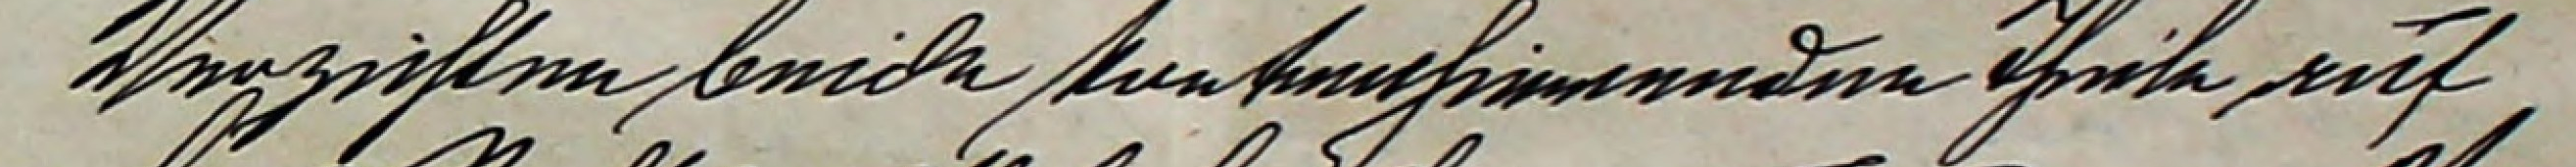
Verzichten beide Kantanchirannden Theile auf
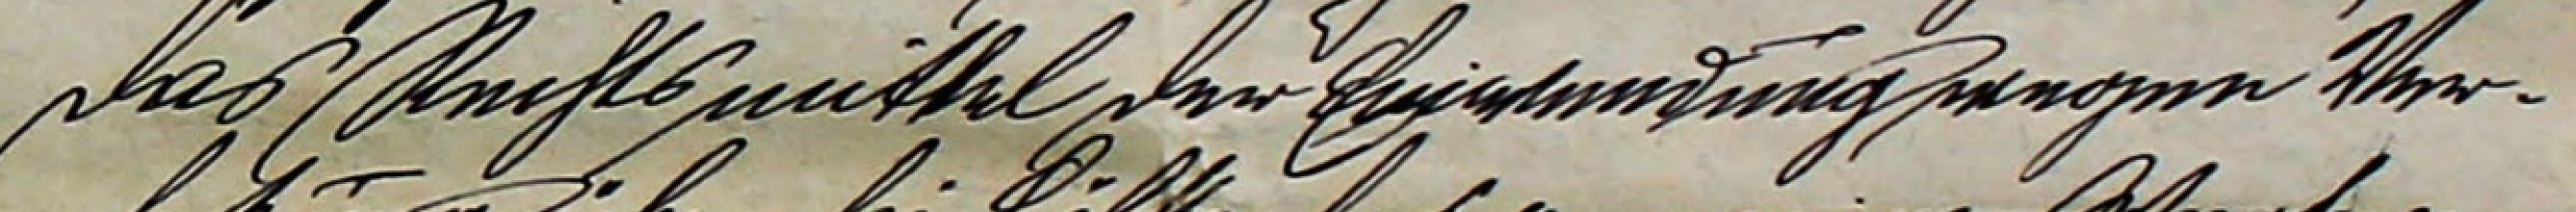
das Rechtsmittel der Einwendung regen Ver-
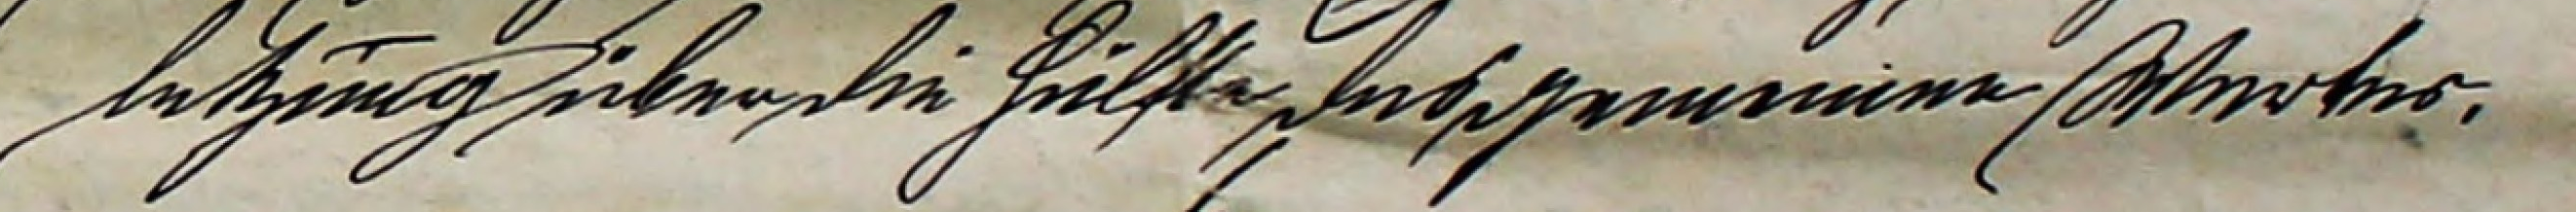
letzung über die Hälfte das gemeinen Wertes.
